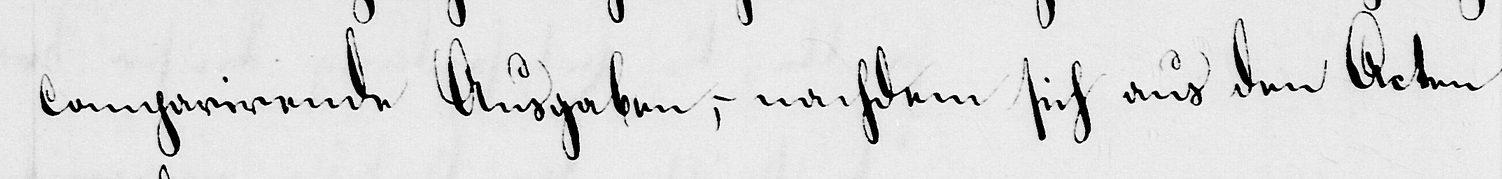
comparirende Ausgaben, – nachdem sich aus den Acten
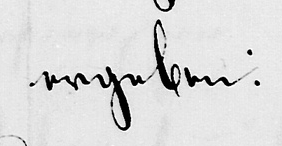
ergeben:
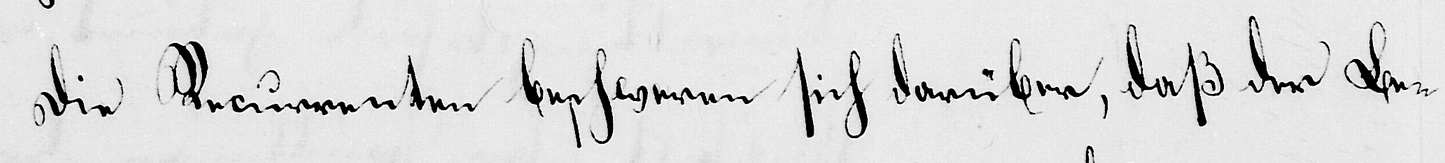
Die Recurrenten beschweren sich darüber, daß der Be¬
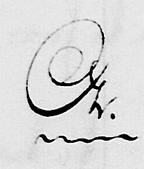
A.
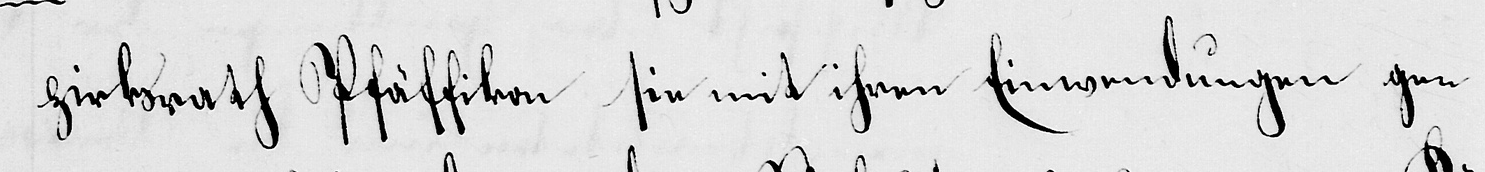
zirksrath Pfäffikon sie mit ihren Einwendungen ge¬
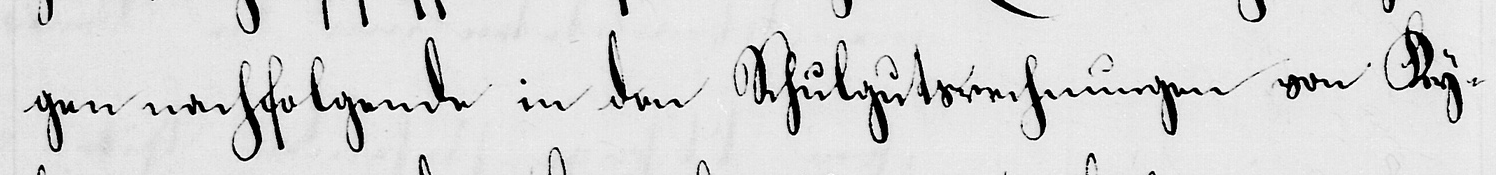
gen nachfolgende in den Schulgutsrechnungen von Ky¬
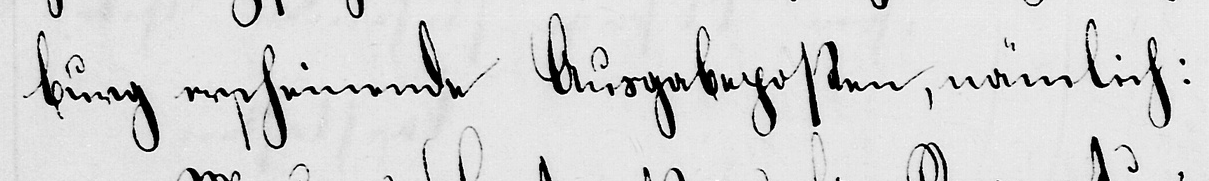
burg erscheinende Ausgabeposten, nämlich:
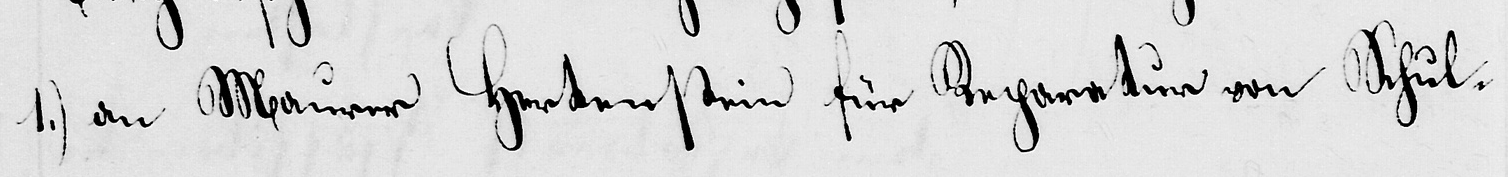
1.) an Maurer Hertenstein für Reparatur von Schul¬
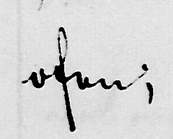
ofen;
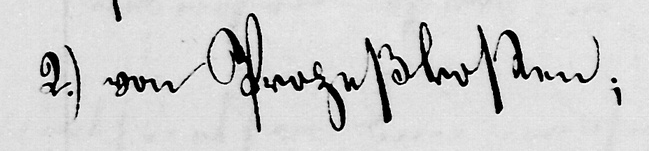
2.) von Prozeßkosten;
